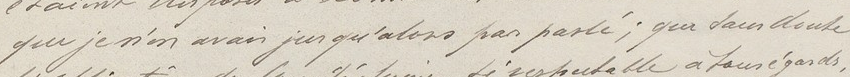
que je n'en avais jusqu'alors pas parlé; que sans doute
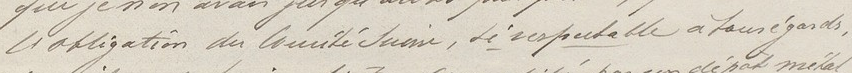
l'obligation du Comité Suisse, sirespectable à tous égards,
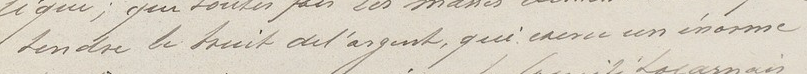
tendre le bruit de l'argent, qui exerce un énorme
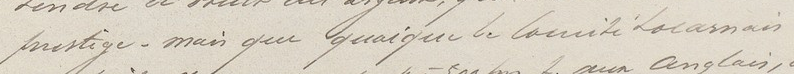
prestige – mais que quoique le Comité Locarnais
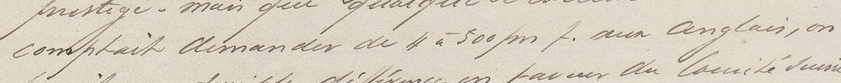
comptait demander de 4 à 500/m f. aux Anglais, on
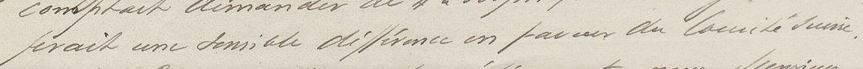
ferait une sensible différence en faveur du Comité Suisse.
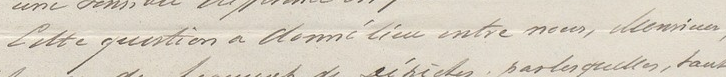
Cette question a donné lieu entre nous, Monsieur,
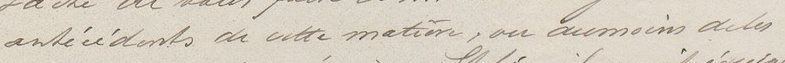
antécédents de cette matière, ou aumoins de les
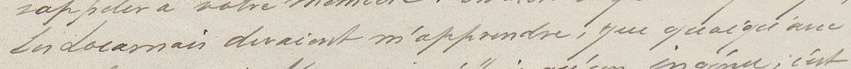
les Locarnais devaient m'apprendre, que quoiqu'avec
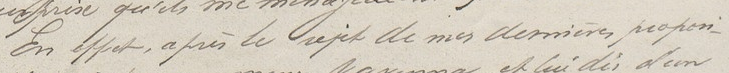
En effet, après le rejet de mes dernières proposi-
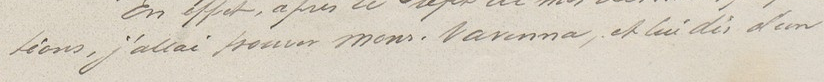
tions, j'allai trouver Mons. Varenna, et lui dis d'un
